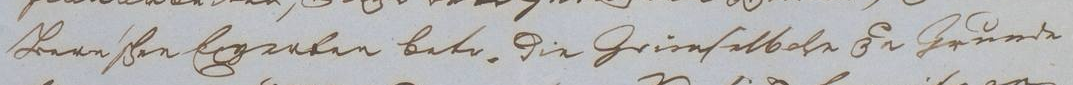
Bern'schen Experten betr. die Grimselbahn zu Grunde-
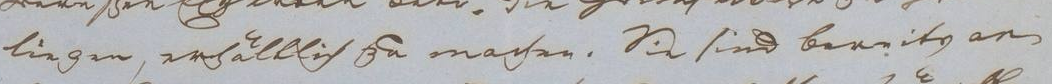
liegen, erhätlich zu machen. Sie sind bereits an
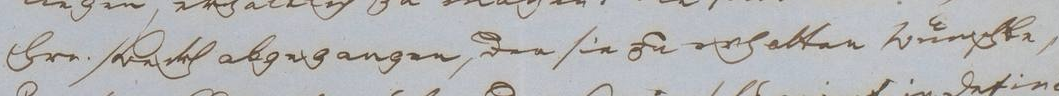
Hrn. Bekh abgegangen, der sie zu erhalten wünschte,
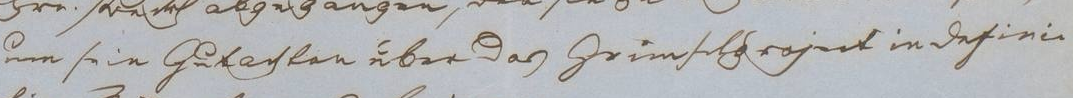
um sein Gutachten über das Grimselproject in defini-
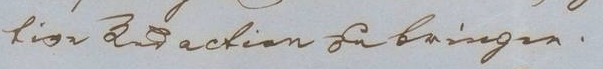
tive Redaction zu bringen.
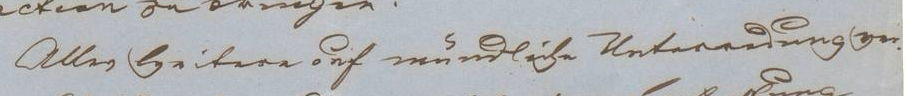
Alles weitere auf mündliche Unterredung ver-
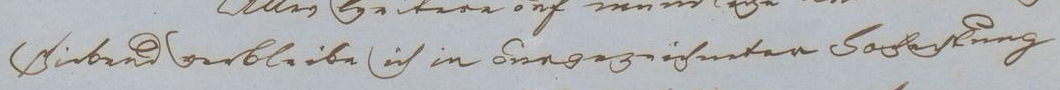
schiebend verbleibe ich in ausgezeichneter Hochachtung
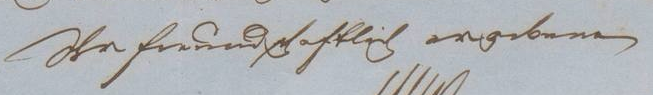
Ihr freundschaftlich ergebene
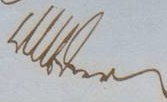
Bern
